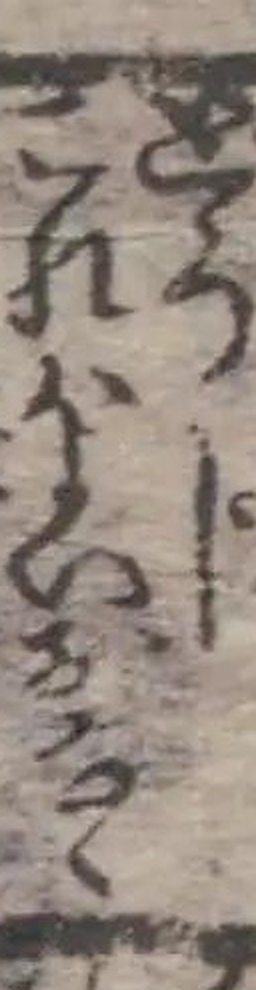これはよいおなく
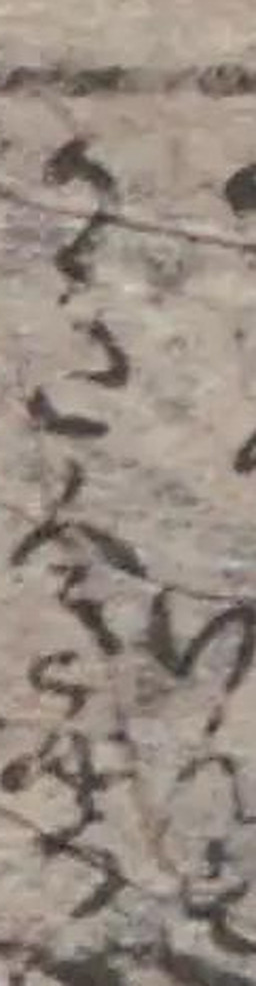き人きやう
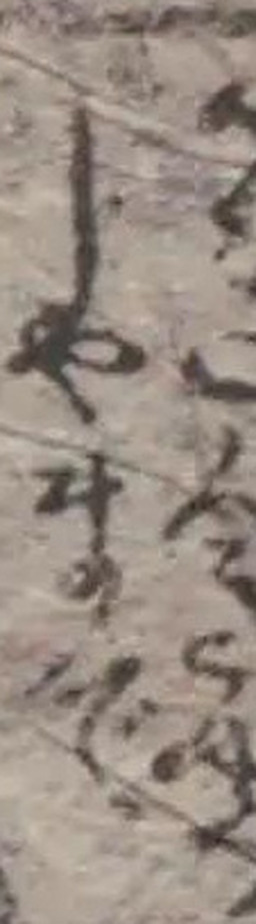しやまで
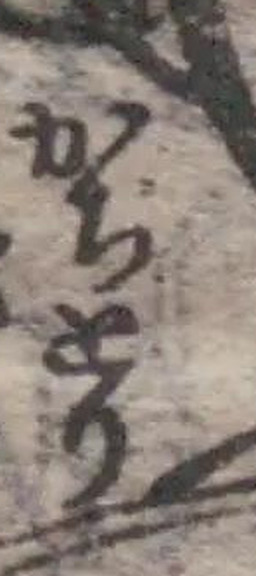かちとり
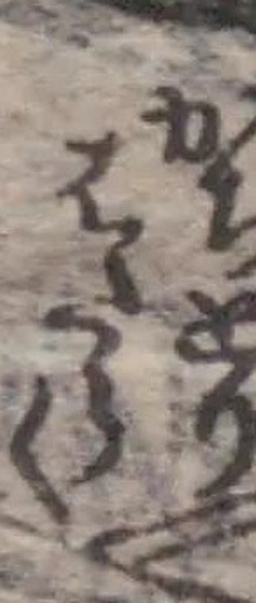はたらく
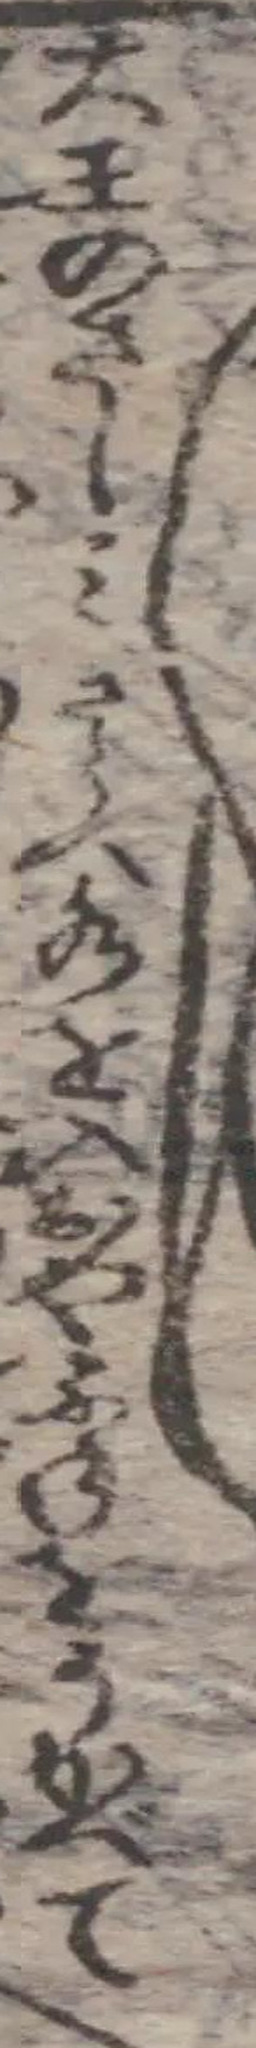大王のさしみさらへ水を入おやふねをうかべて
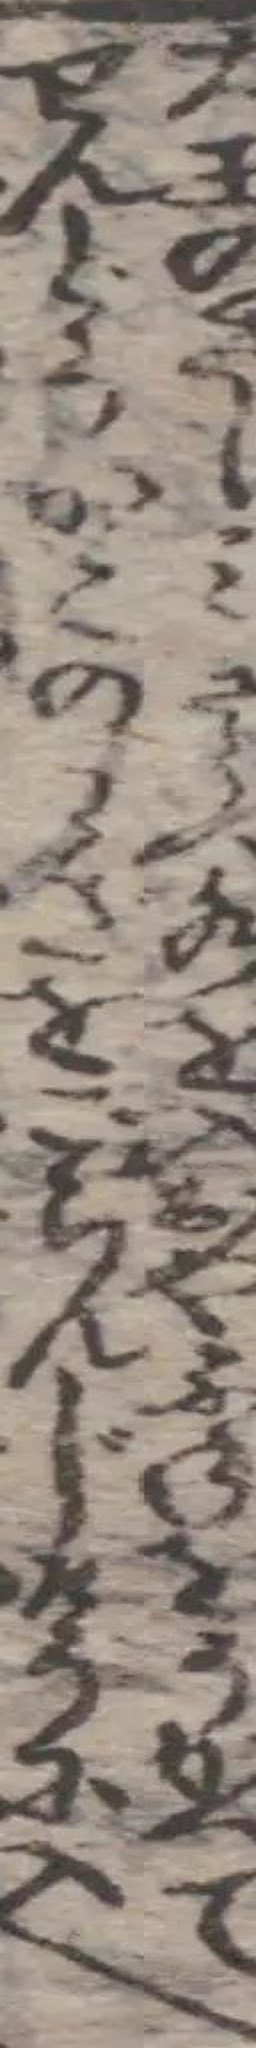せんどうかこのわざをごらんじけうに入
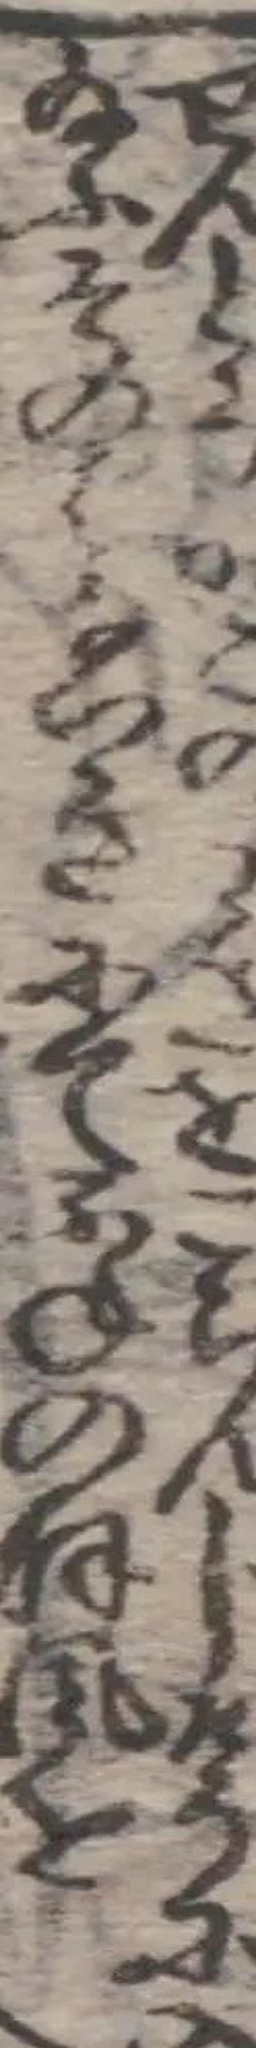給ふそのはないきにてふねのほ風を
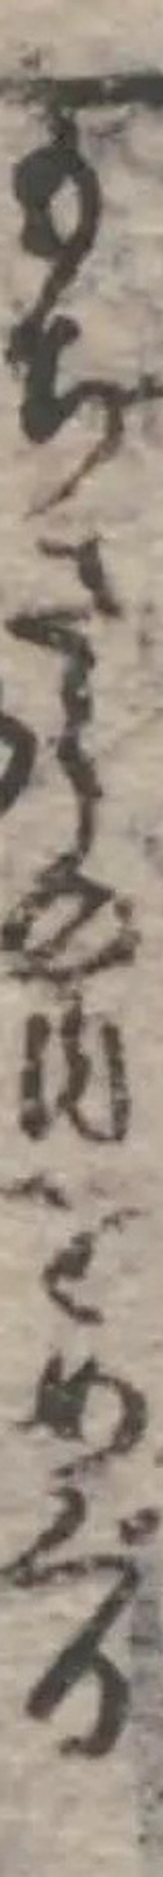もちさらの内をめぐる
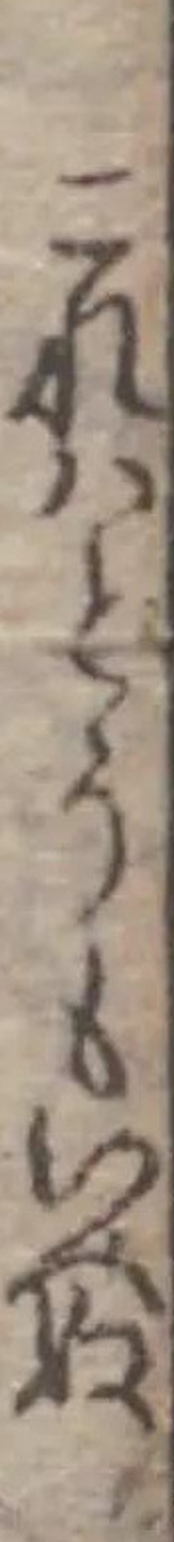これはとうもいへぬ
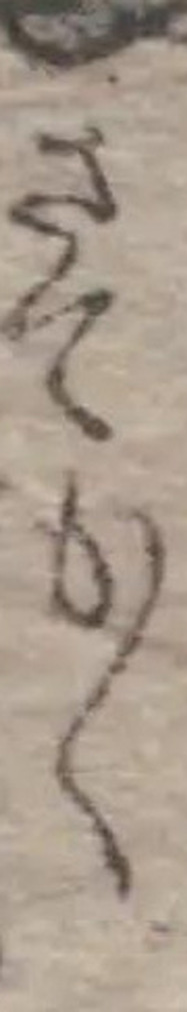さても〳〵
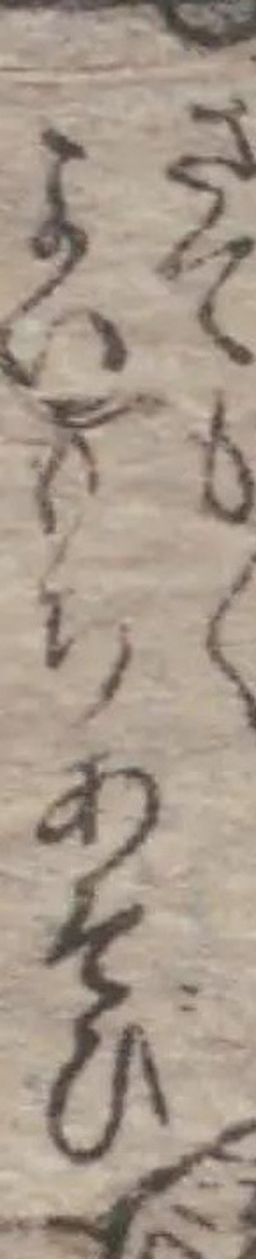よいもちあそび
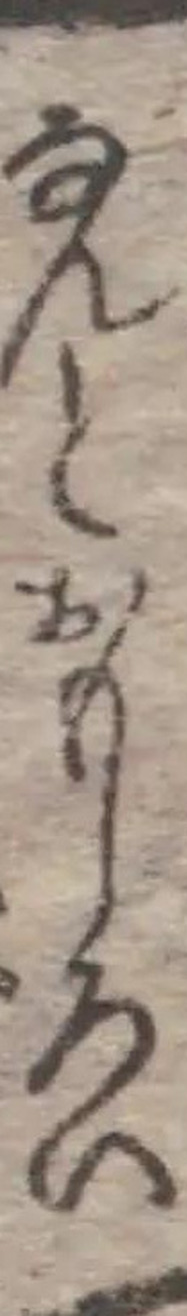なんとおもしろい
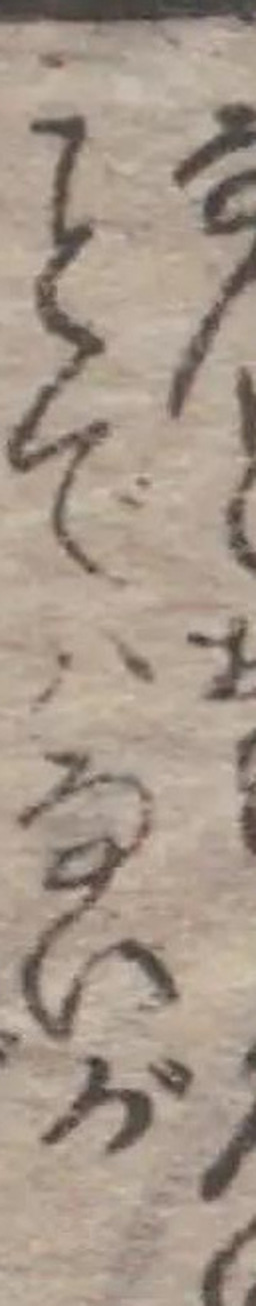ことではないが
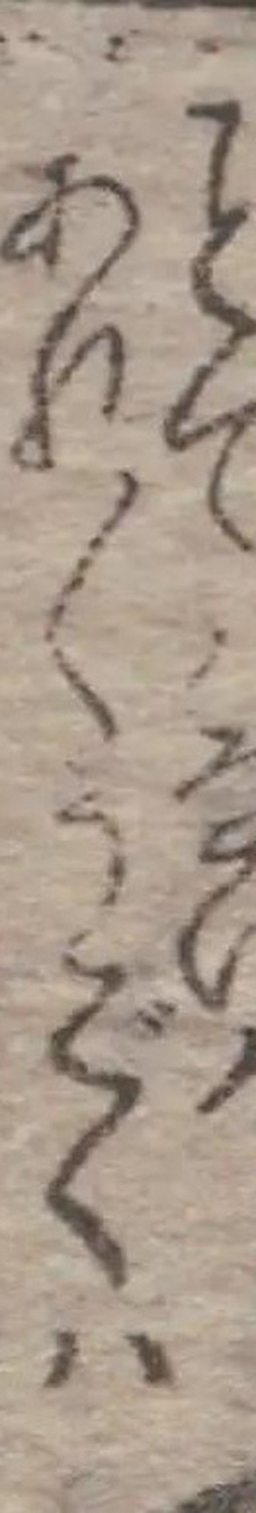あれ〳〵うごくは

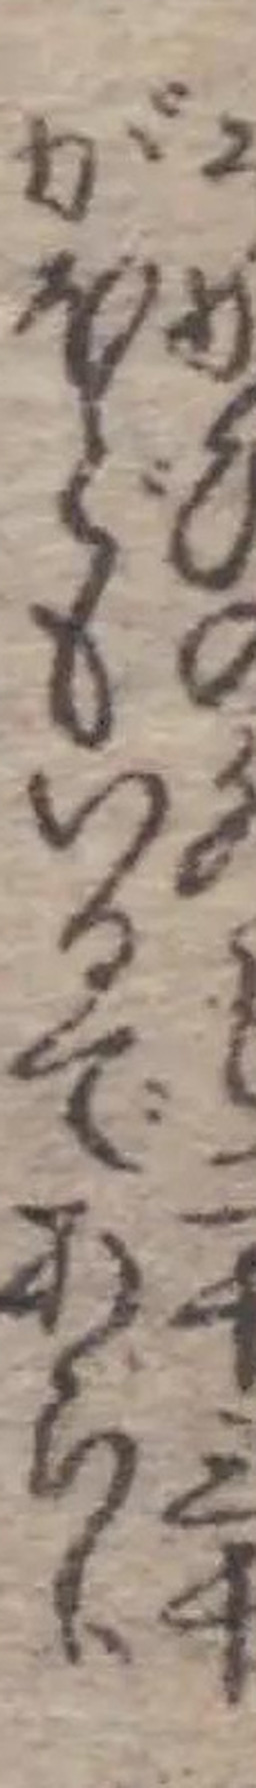がほどもいるであら
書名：五たいそう
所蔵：国立国会図書館 National Diet Library, JAPAN
